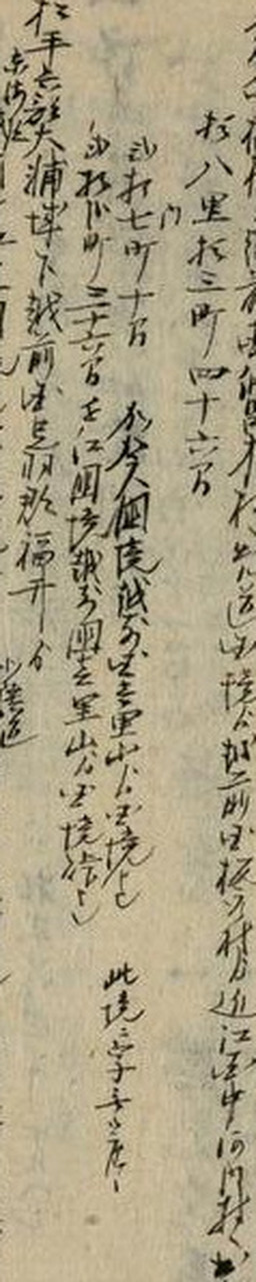弐拾七町十間加賀国境越前国壱里山ゟ国境迄此境ニ字無御座候
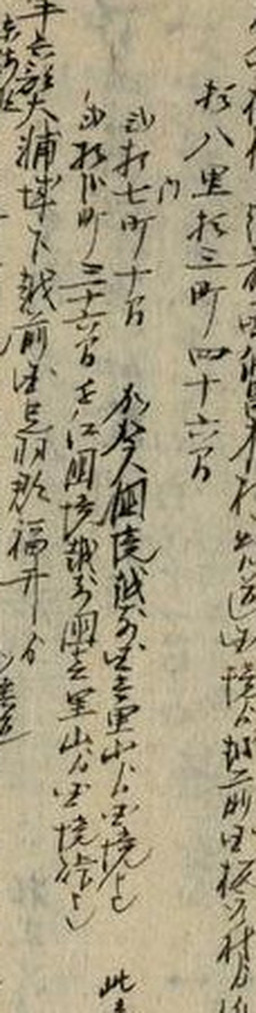弐拾七町十間加賀国境越前国壱里山ゟ国境迄此境ニ字無御座候
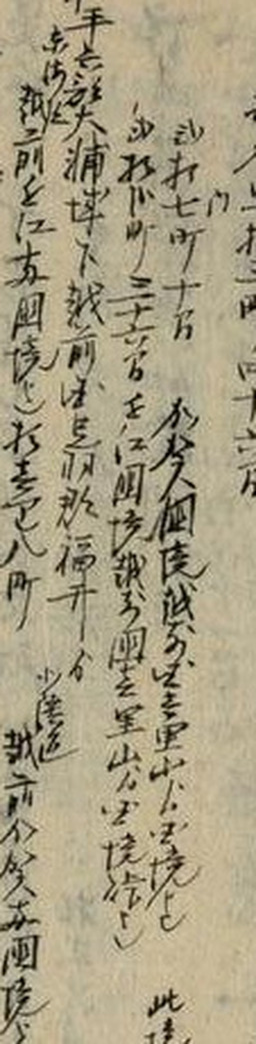弐拾弐町三十六間近江国境越前国壱里山ゟ国境迄峠迄
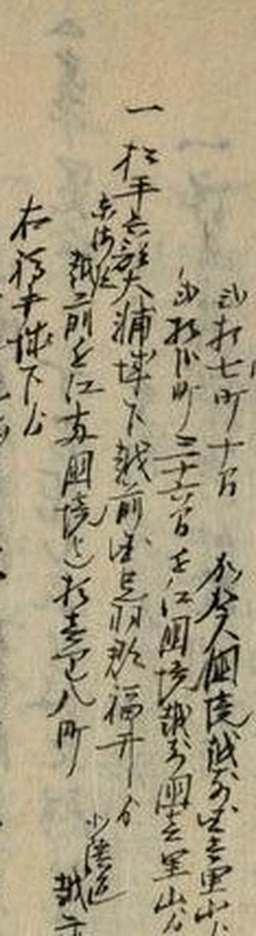一松平兵部大輔城下越前国足羽郡福井ゟ
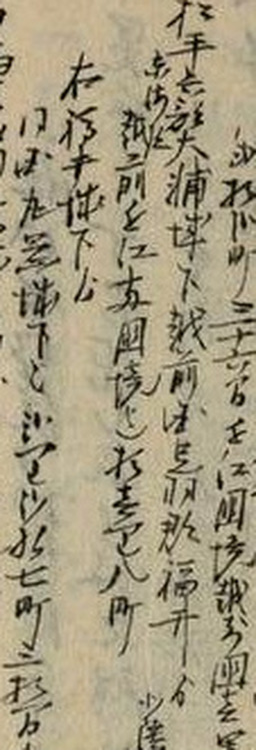東海道越前近江両国境迄拾壱里八町
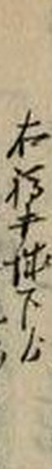右福井城下ゟ
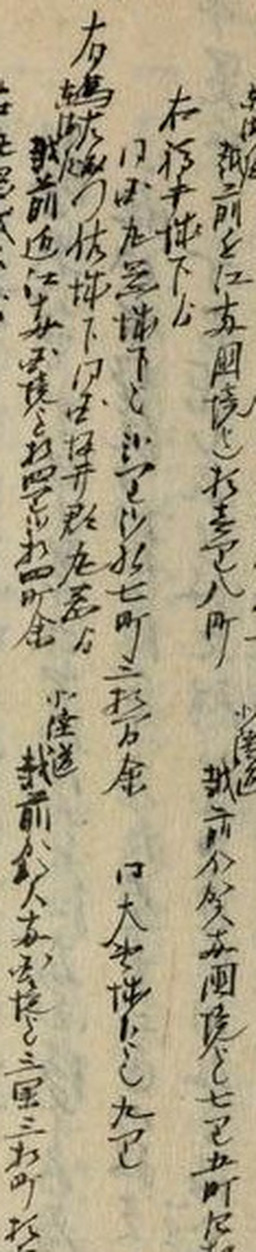同国丸岡城下迄弐里弐拾七町三拾間余同大野城下迄九里
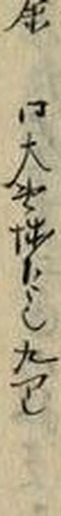同国大野城下迄九里
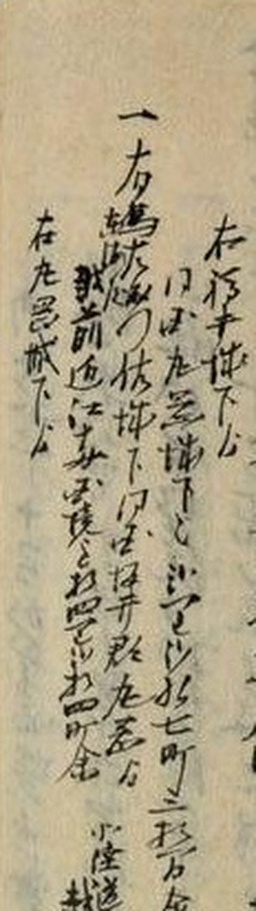一有馬左衛門佐城下同国坂井郡丸岡ゟ
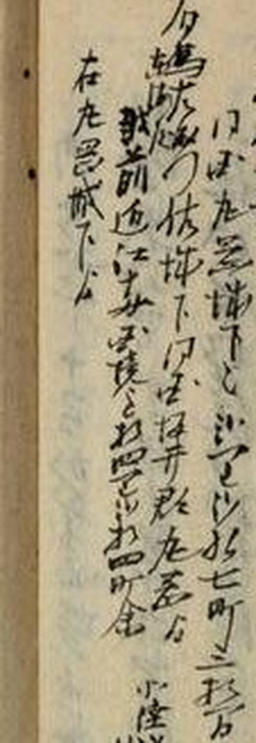東海道越前近江両国境迄拾四里弐拾四町余
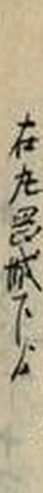右丸岡城下ゟ
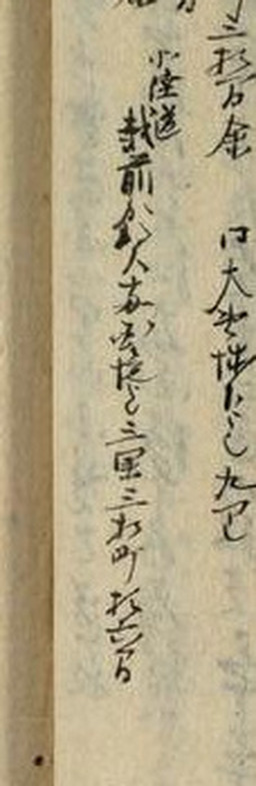北陸道越前加賀両国境迄三里三拾町拾六間
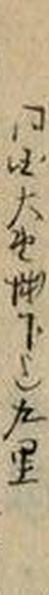同国大野城下迄九里
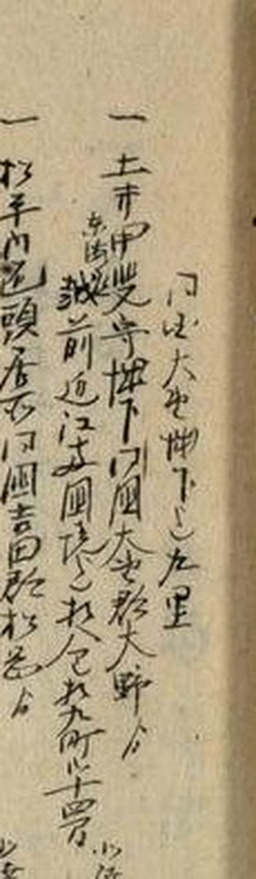一土井甲斐守城下同国大野郡大野ゟ
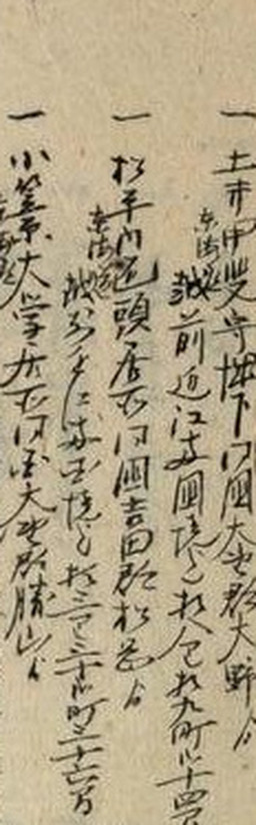一松平内匠頭居所同国吉田郡松岡ゟ
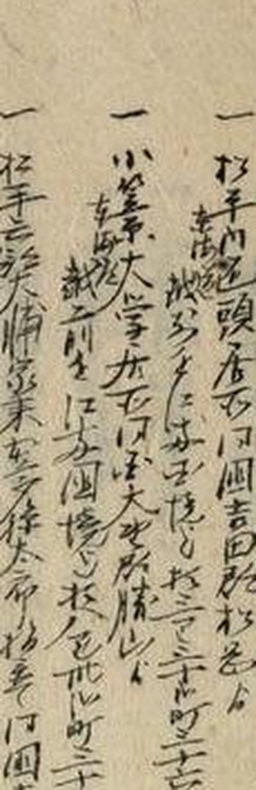一小笠原大学居所同国大野郡勝山ゟ
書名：御国他国諸事之部
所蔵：福井県文書館 Fukui Prefectural Archives
